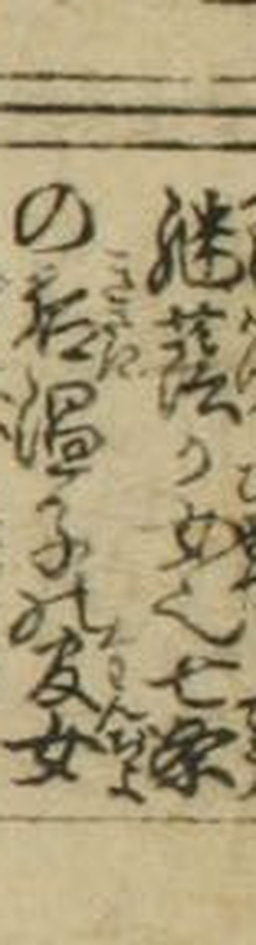の后温子の官女
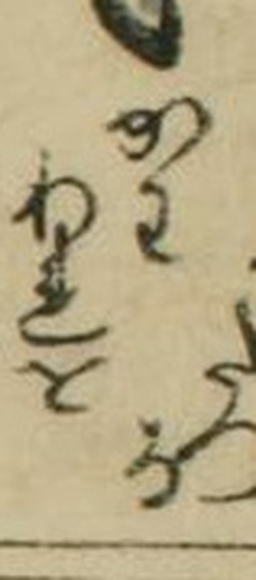われを
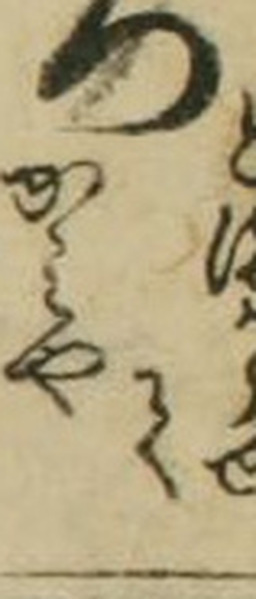かみや
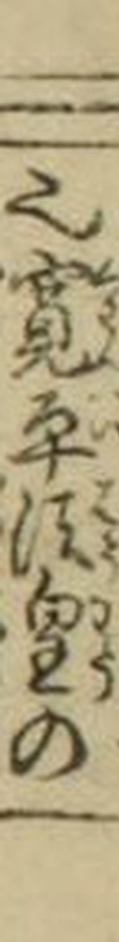也寛平法皇の
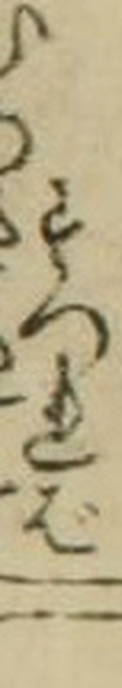すつれば
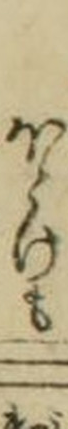ほとけも
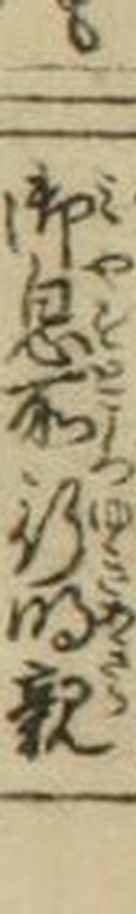御息所行明親
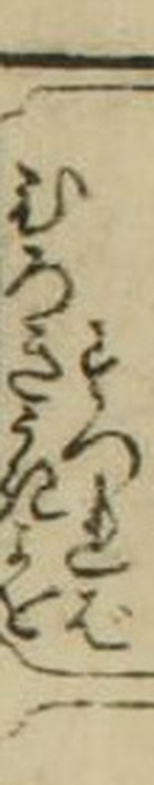ひろきうきよを
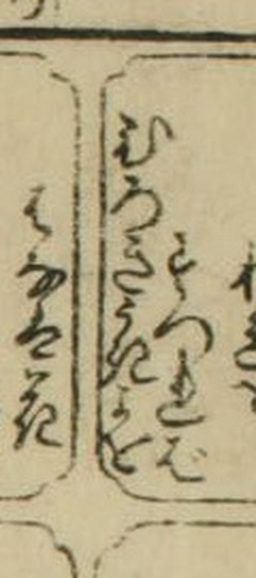ひろきうきよを
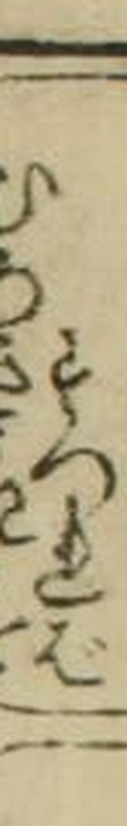ひろきうきよを
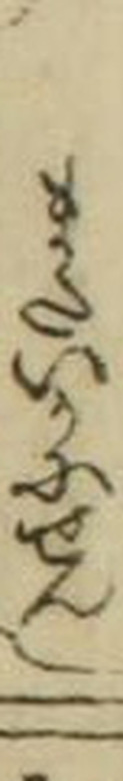またいかにせん
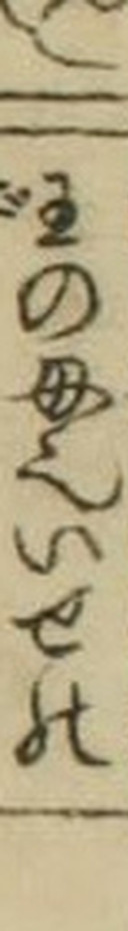王の母也いせの
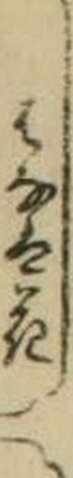はなは花
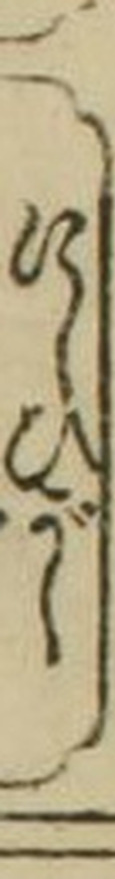にしひがし
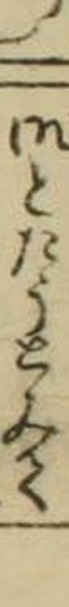御とたうとみて
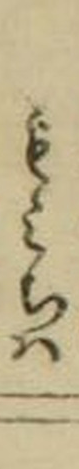もみちは
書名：女源氏教訓鑑
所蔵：東京学芸大学附属図書館
